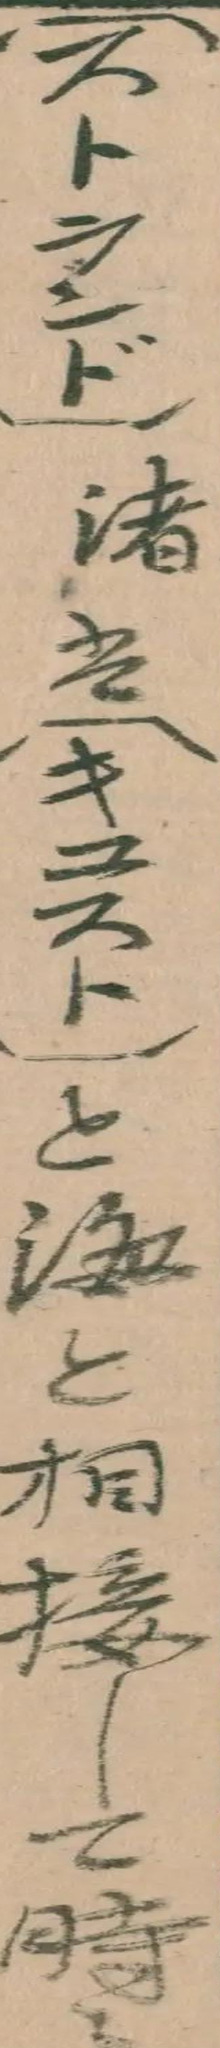(ストランド)渚は(キュスト)と海と相接して時に
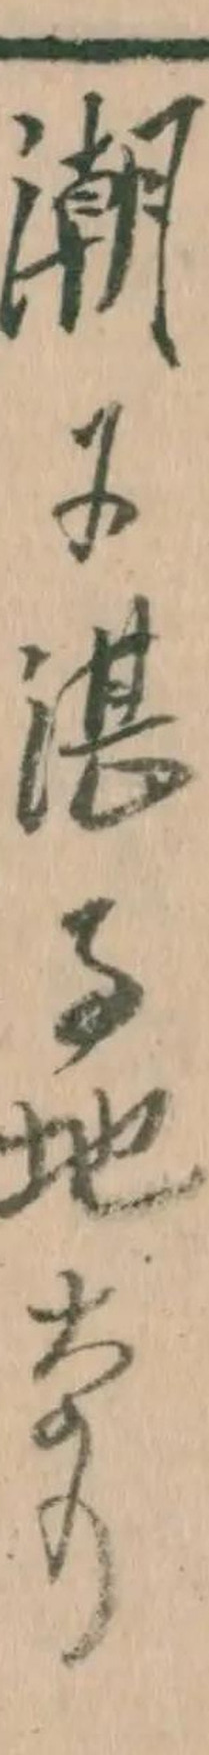潮に湛る地なり
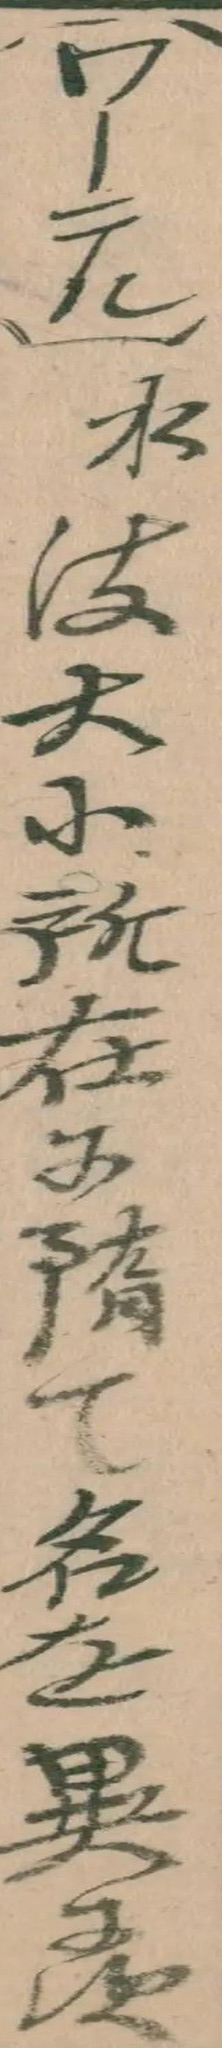(ワーテル)水は大小所在に随て名を異にす
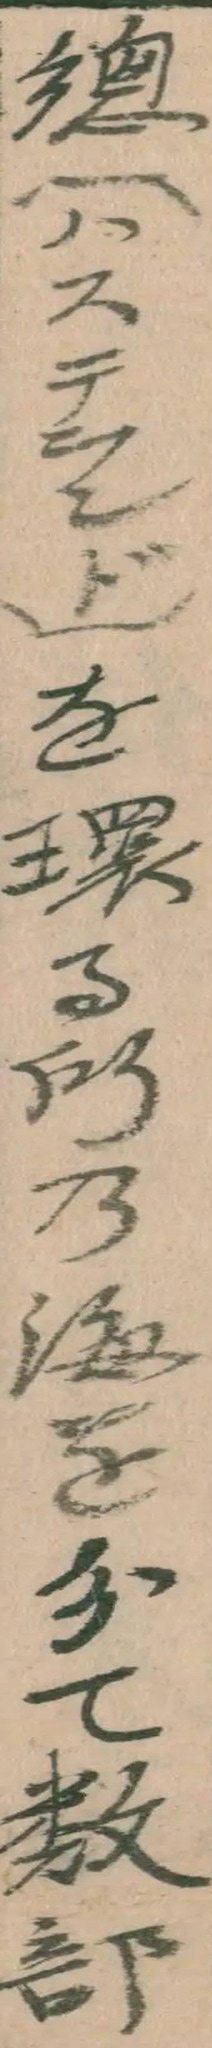総(ハステランド)を環る所の海を分て数部
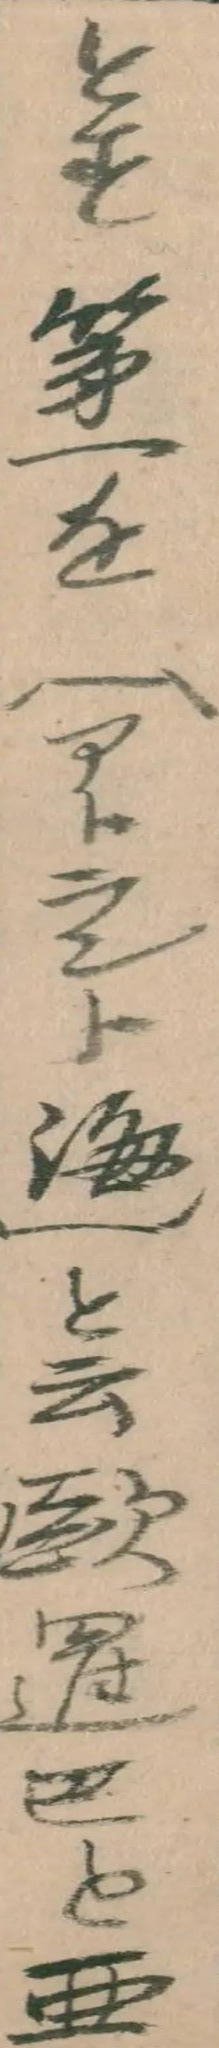とす第一を(アトラント海)と云欧邏巴と亜
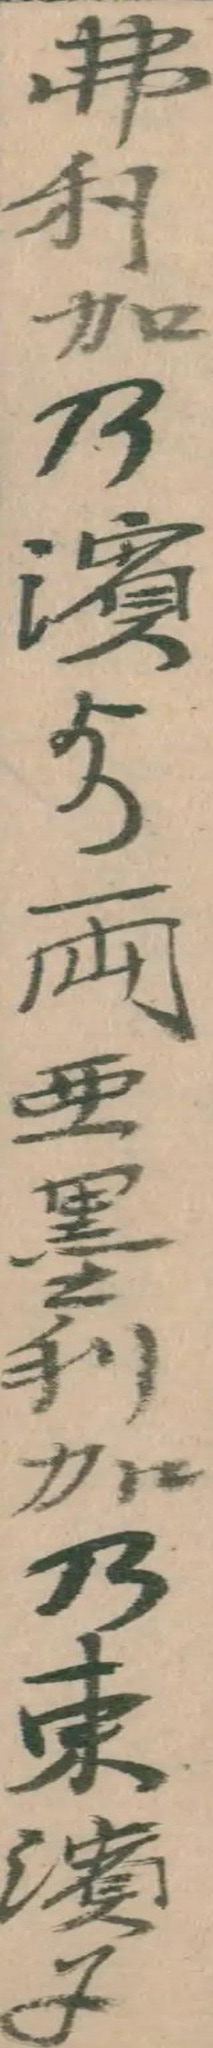弗利加の浜より両亜墨利加の東浜に

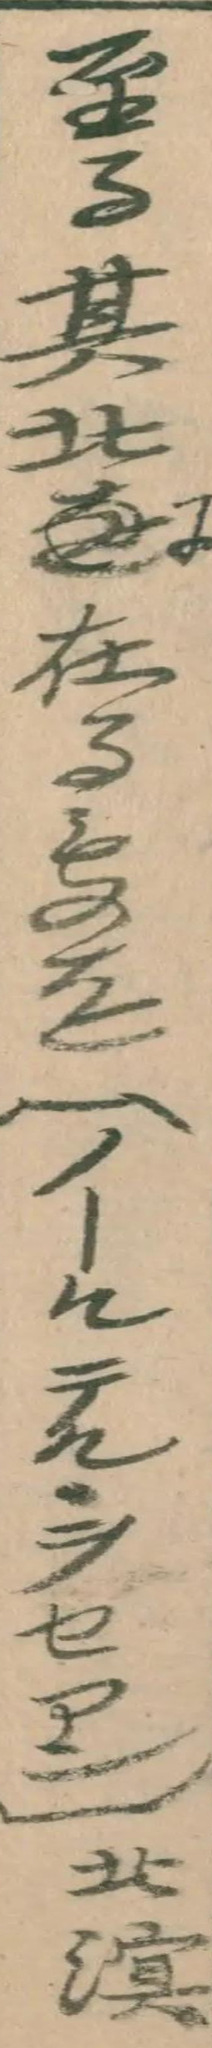至る其北に在るものを(ノールテル・ヲセアン)北浜
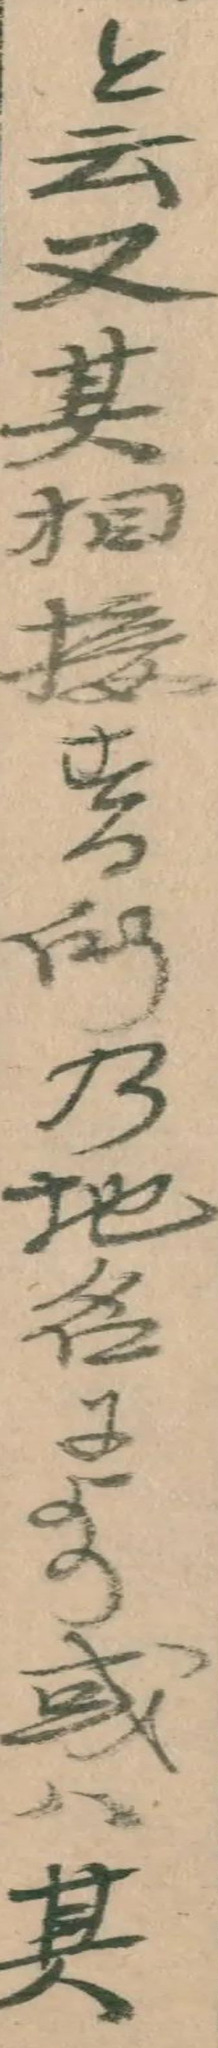と云又其相接する所の地名により或は其
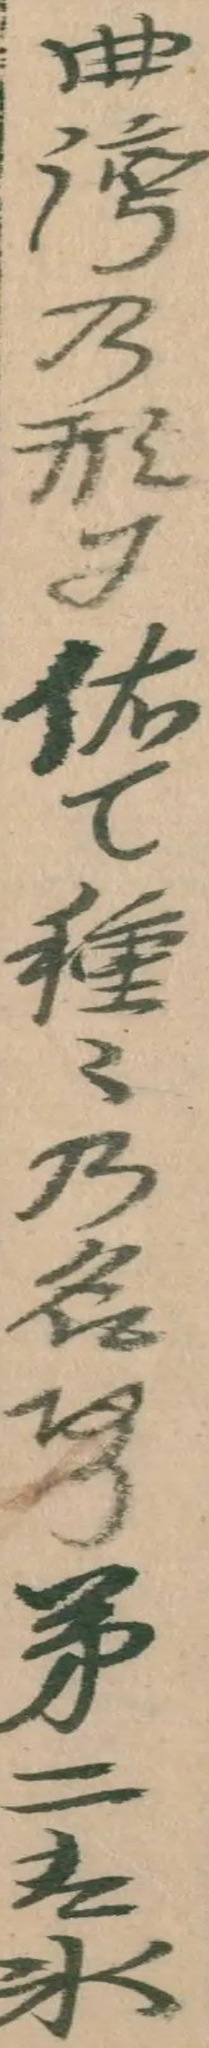曲湾の形に佑て種々の名あり第二は氷
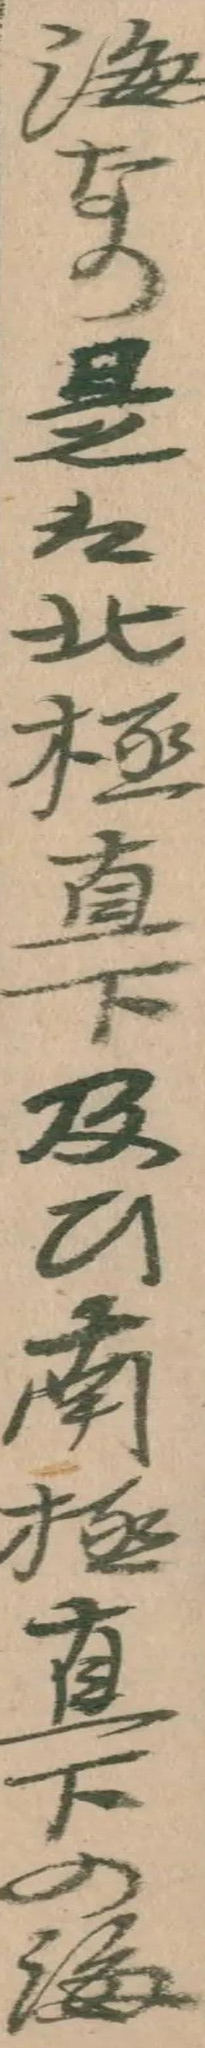海なり是は北極直下及ひ南極直下の海
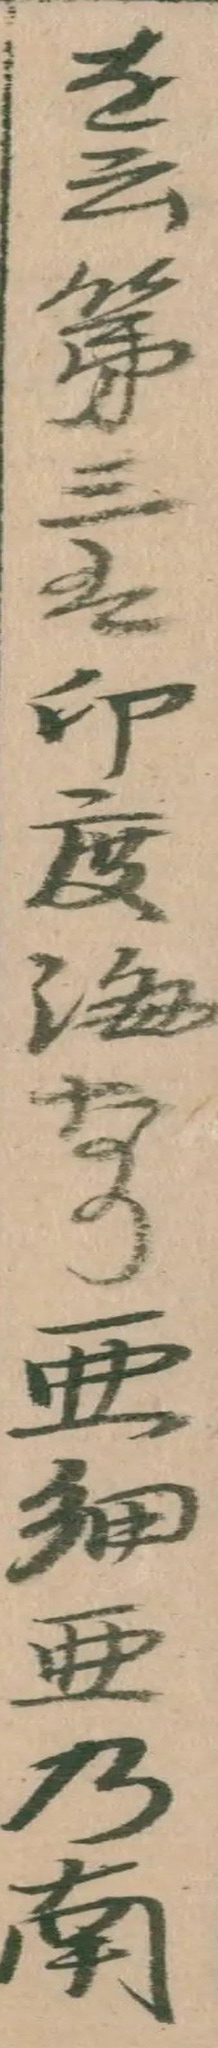を云第三は印度海なり亜細亜の南
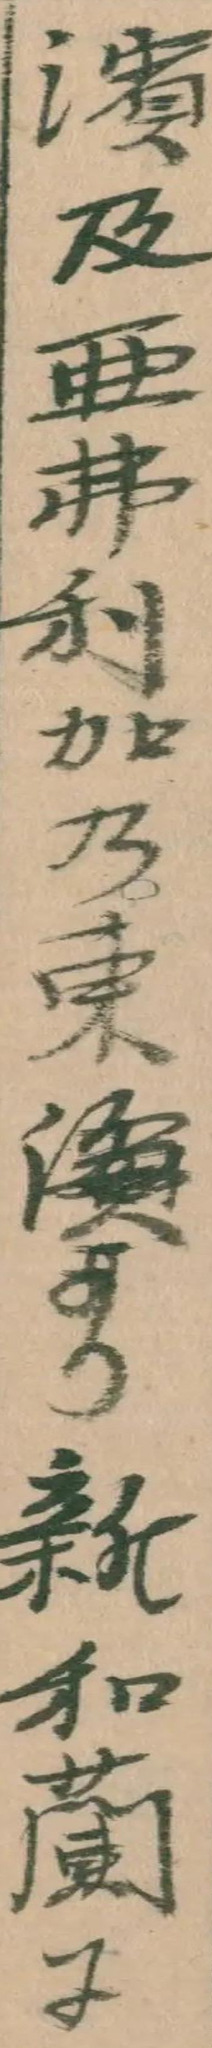浜及亜弗利加の東浜より新和蘭に
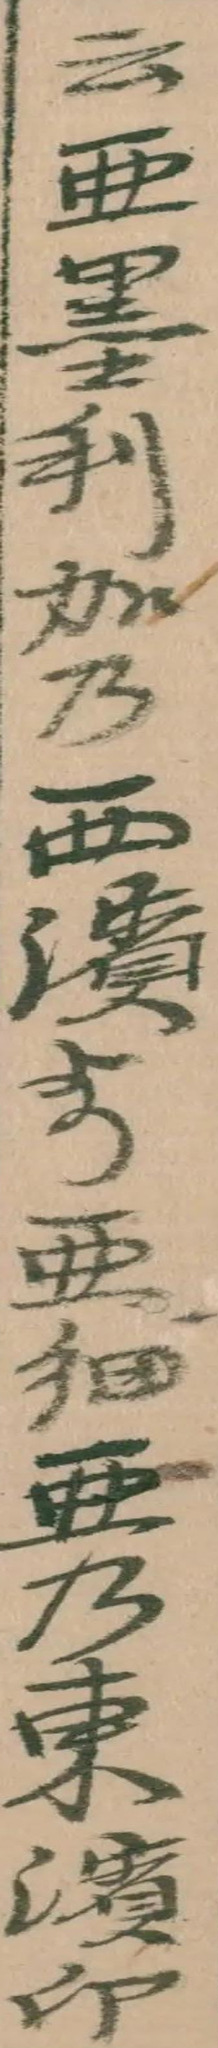云亜墨利加の西浜より亜細亜の東浜印
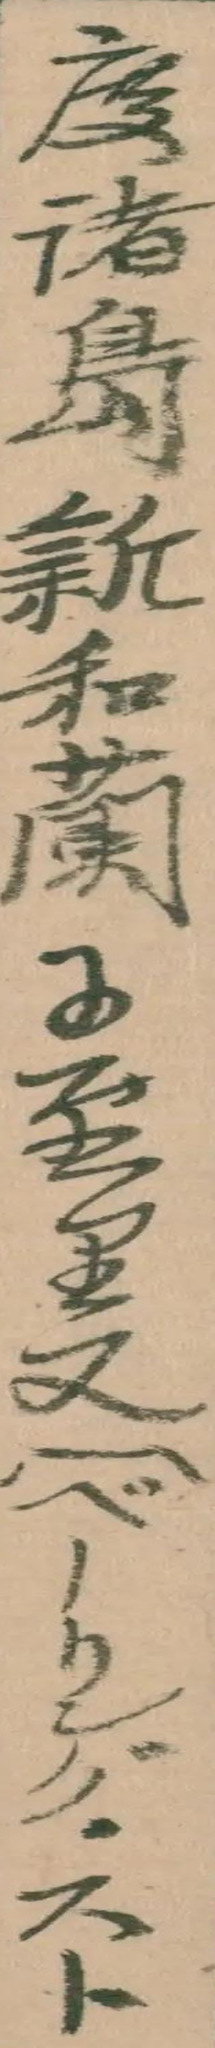度諸島新和蘭に至り又(ベーリング・スト
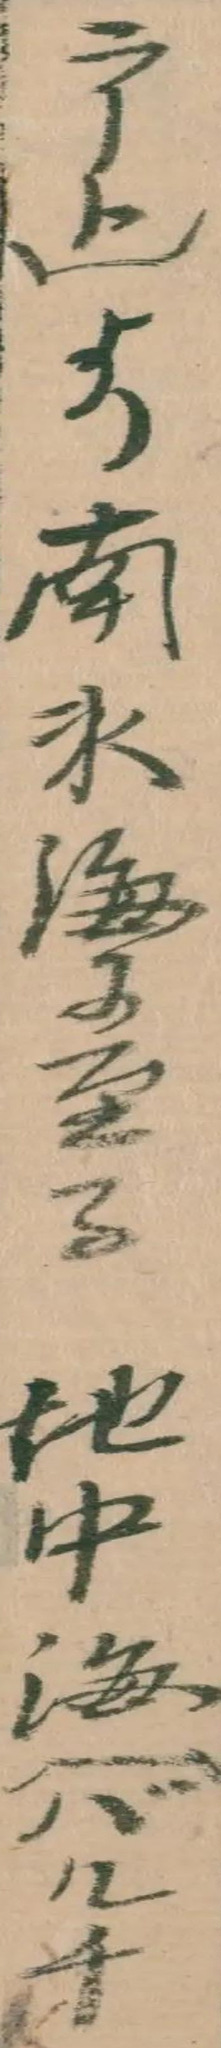ラート)より南氷海に至る地中海(バルチ
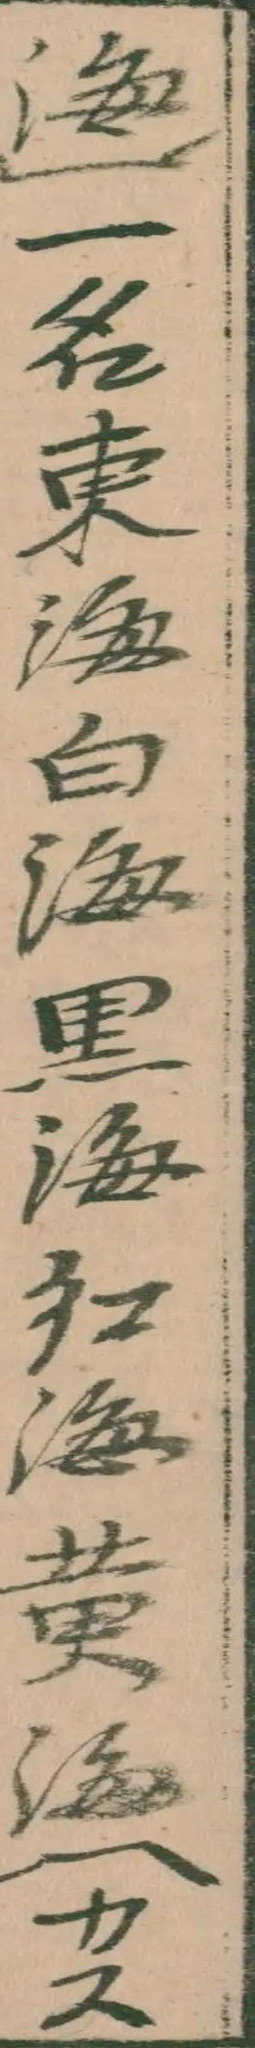海)一名東海白海黒海紅海黄海(カス
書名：新釈輿地図説
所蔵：国立国会図書館 National Diet Library, JAPAN
